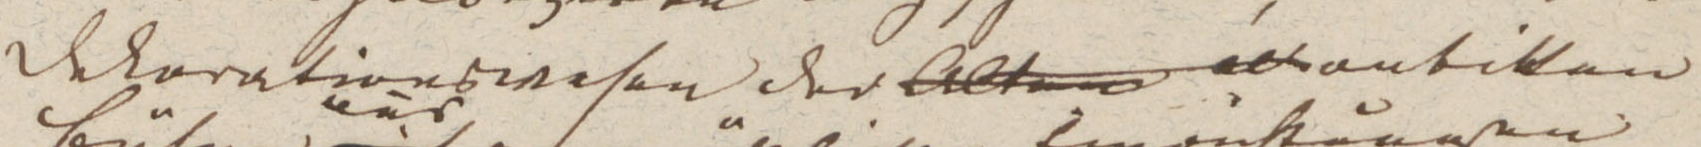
Dekorationswesen der Alten al antiken
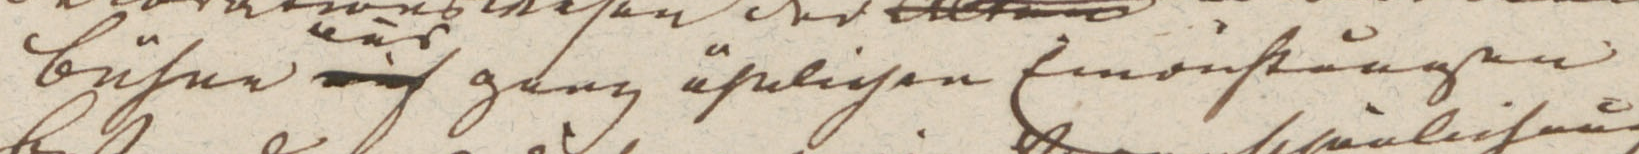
Bühne auf aus ganz ähnlichen Einrichtungen
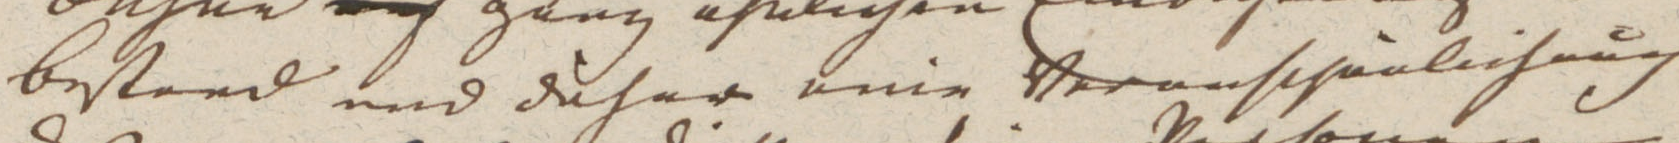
bestand und dieser eine Veranschaulichung
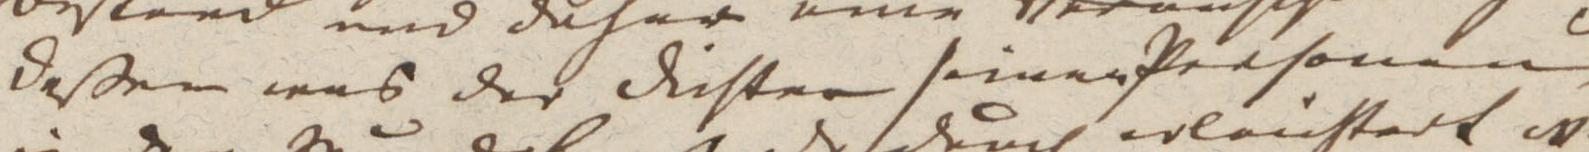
dessen was der Dichter seinen Personen
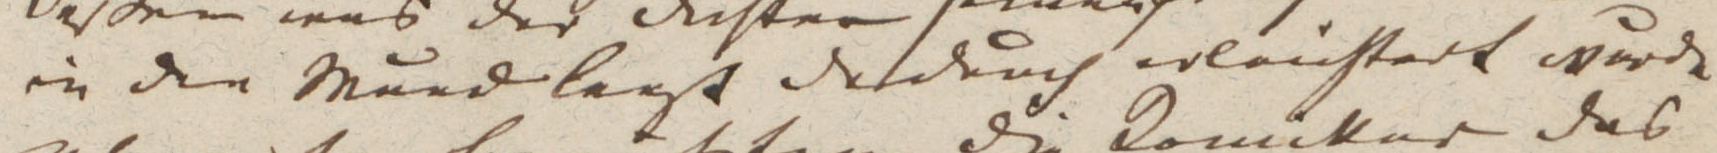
in den Mund legt dadurch erleichtert wurde
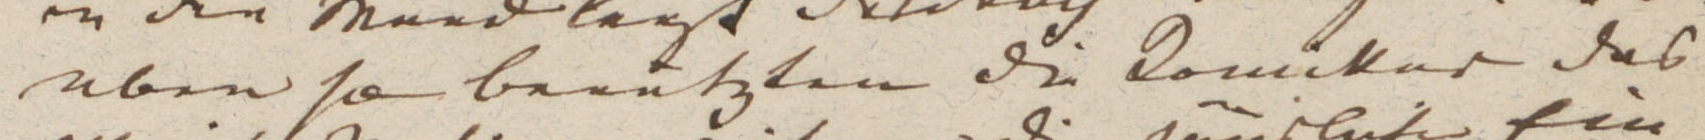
eben so benützten die Komiker das
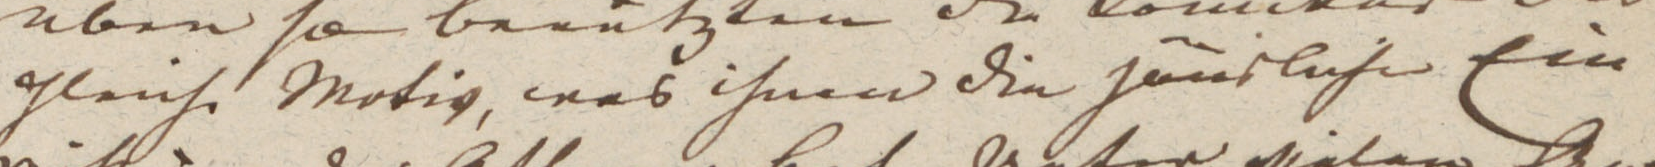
gleiche Motiv, was ihnen die häusliche Ein-
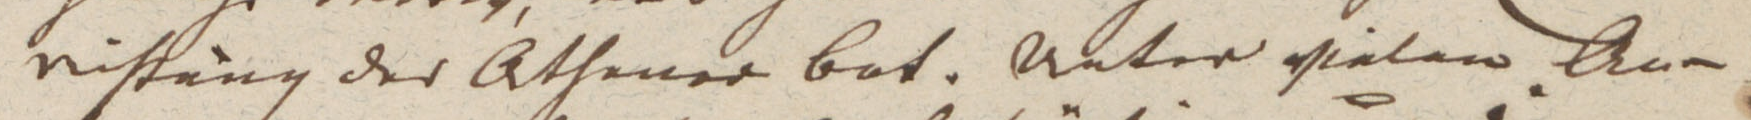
richtung der Athener bot. Unter vielen An-
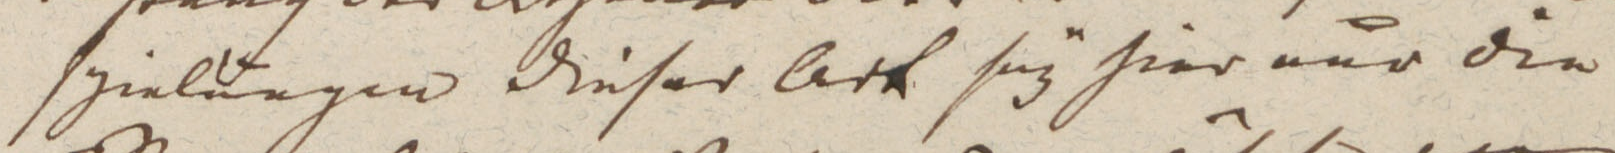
spielungen dieser Art sey hier nur die
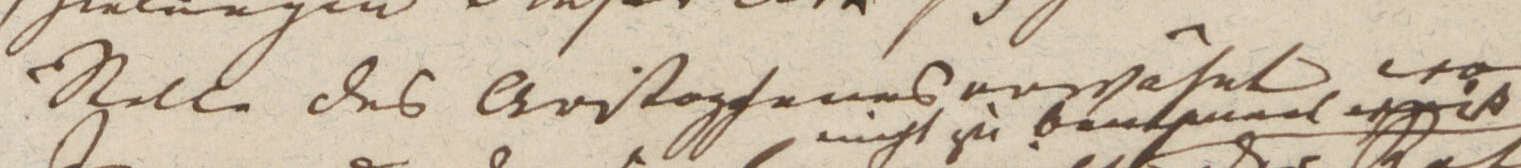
Stelle des Aristophanes erwähnt, wo
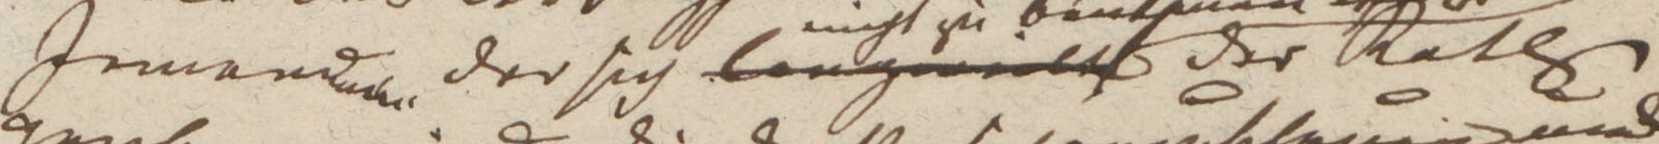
Jemandem, der sich langweilt nicht zu benehmen
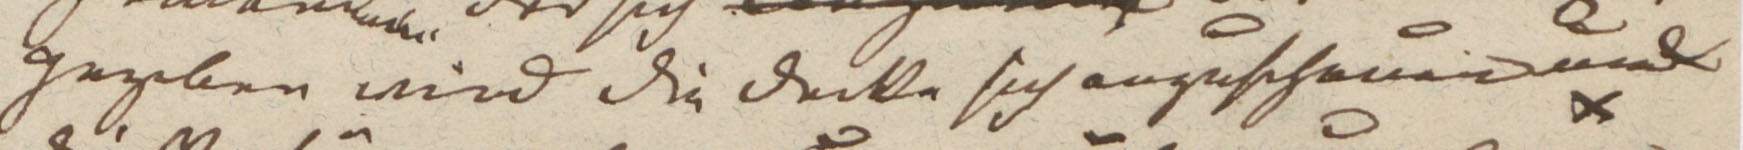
gegeben wird die Decke sich anzuschauen und
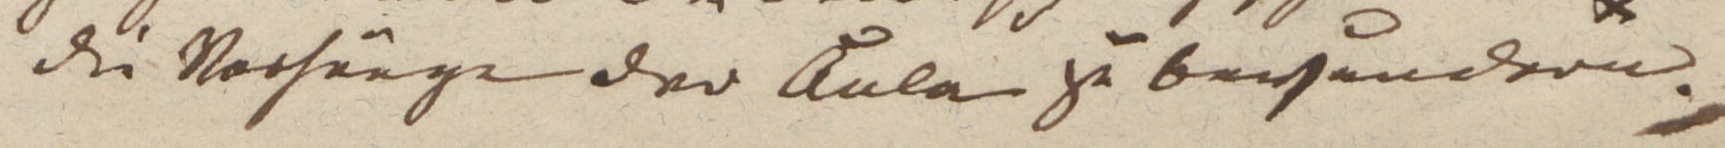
die Vorhänge der Aula zu bewundern. %
